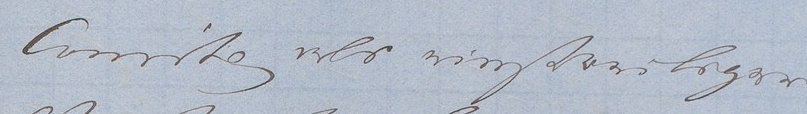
Comite als einstweiliger
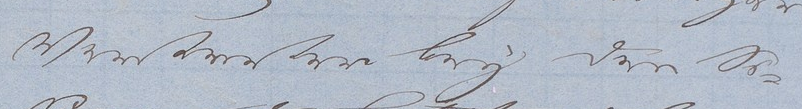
Vertreter bey den Si-
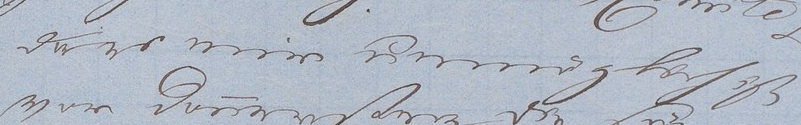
da es mir unmöglich ist
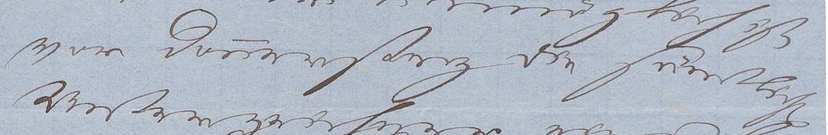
vor Donnerstag die sämtlichen
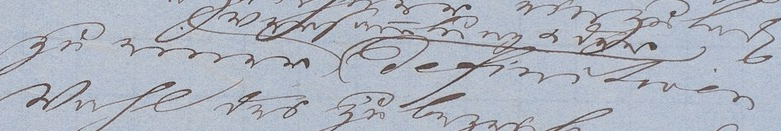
zu einer Versammlung & der definitiven
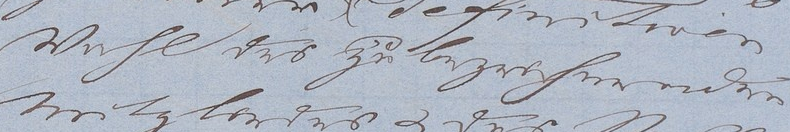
Wahl des zu bezeichnenden
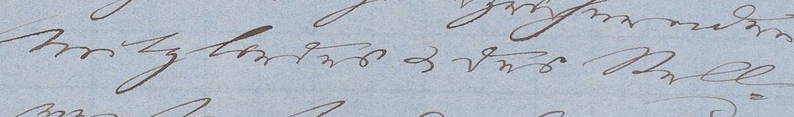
Mitgliedes & des Stell-
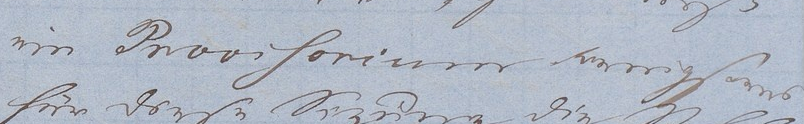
ein Provisorium wenigstens
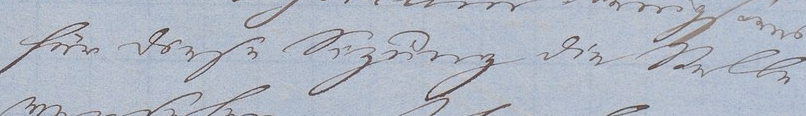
für diese Sizung die Stelle
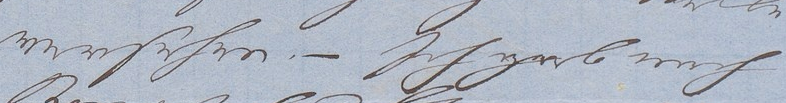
versehen. – Ich gab nach
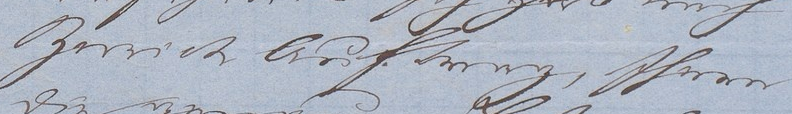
Zürich Auftrag, Ihnen
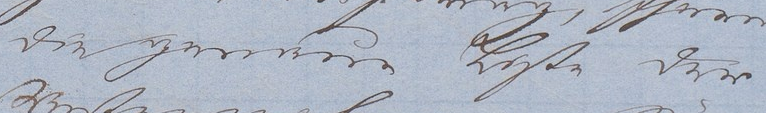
die genaue Liste der
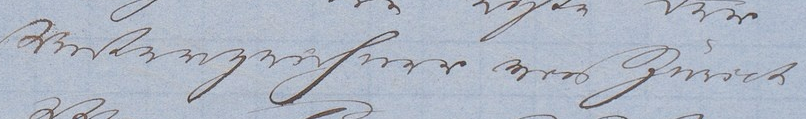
Unterzeichner von Zürich
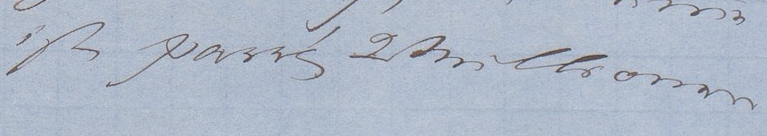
ist passé 2 Millionen
